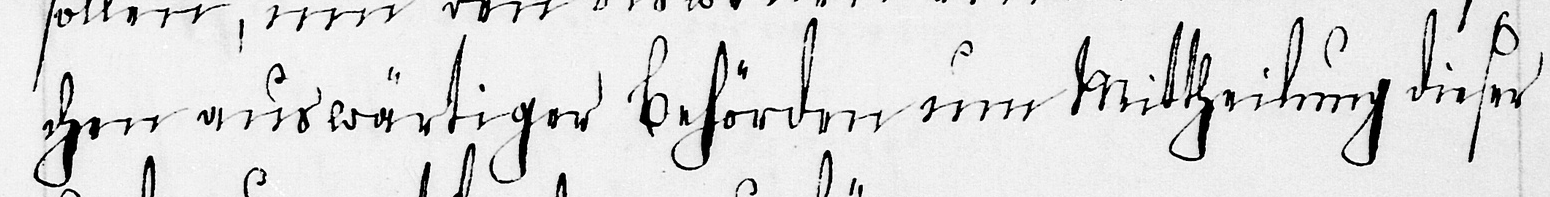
chen auswärtiger Behörden um Mittheilung dieser
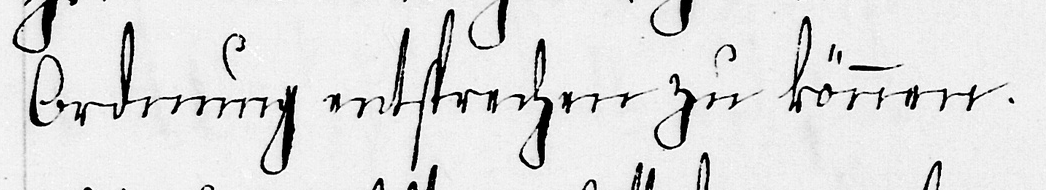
Ordnung entsprechen zu können.
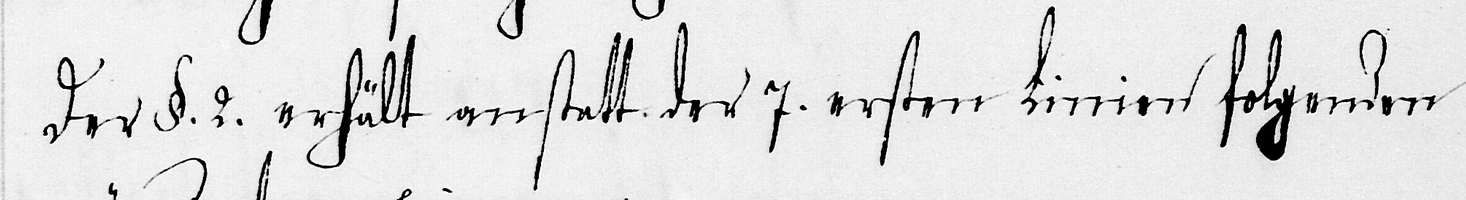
Der §. 2. erhält anstatt der 7. ersten Linien folgenden
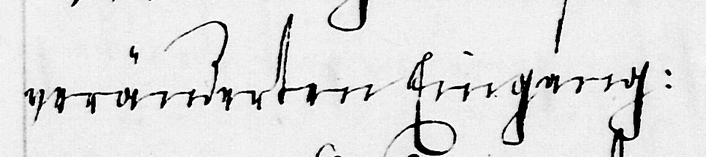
veränderten Eingang:
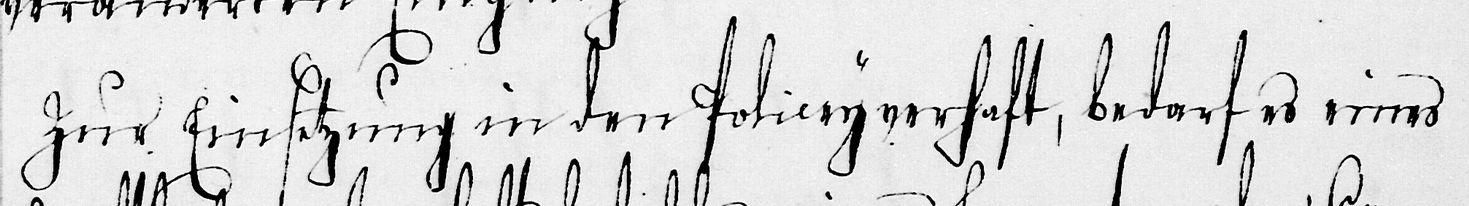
Zur Einsetzung in den Policeyverhaft, bedarf es eines
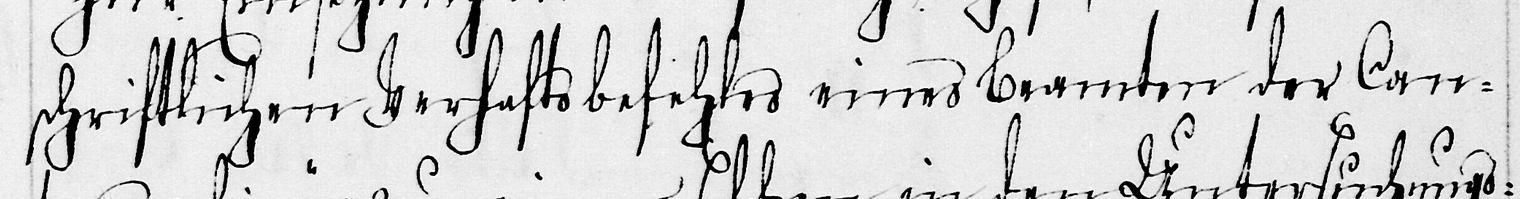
schriftlichen Verhaftsbefehles eines Beamten der Can¬
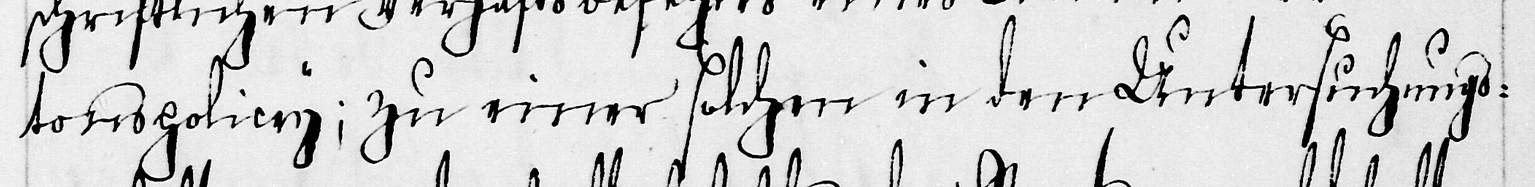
tonspolicey; zu einer solchen in den Untersuchungs¬
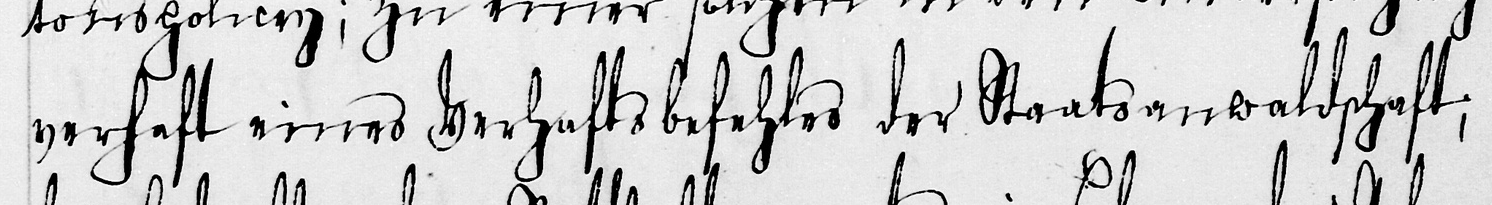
verhaft eines Verhaftsbefehles der Staatsanwaldschaft,
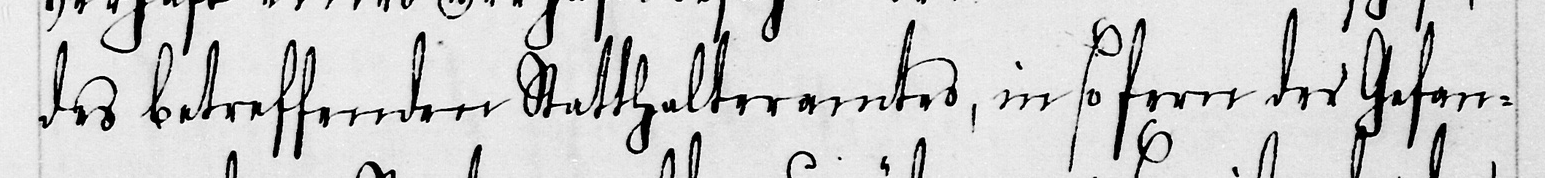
des betreffenden Statthalteramtes, in sofern der Gefan¬
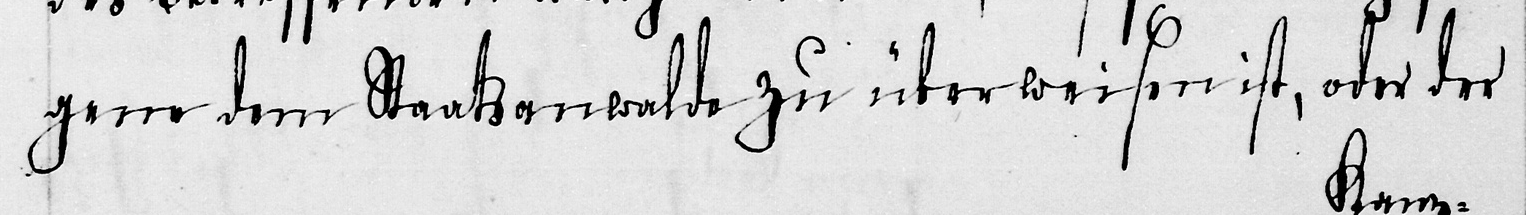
gene dem Staatsanwalde zu überweisen ist, oder der
